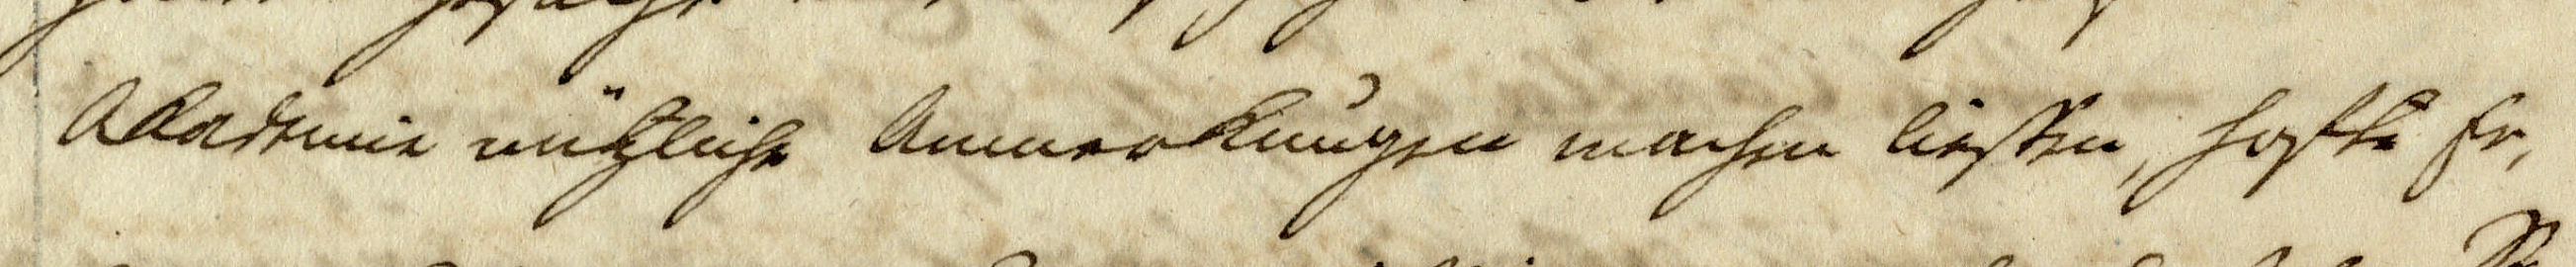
Akademie nützliche Anmerkungen machen liessen, hofte Er,
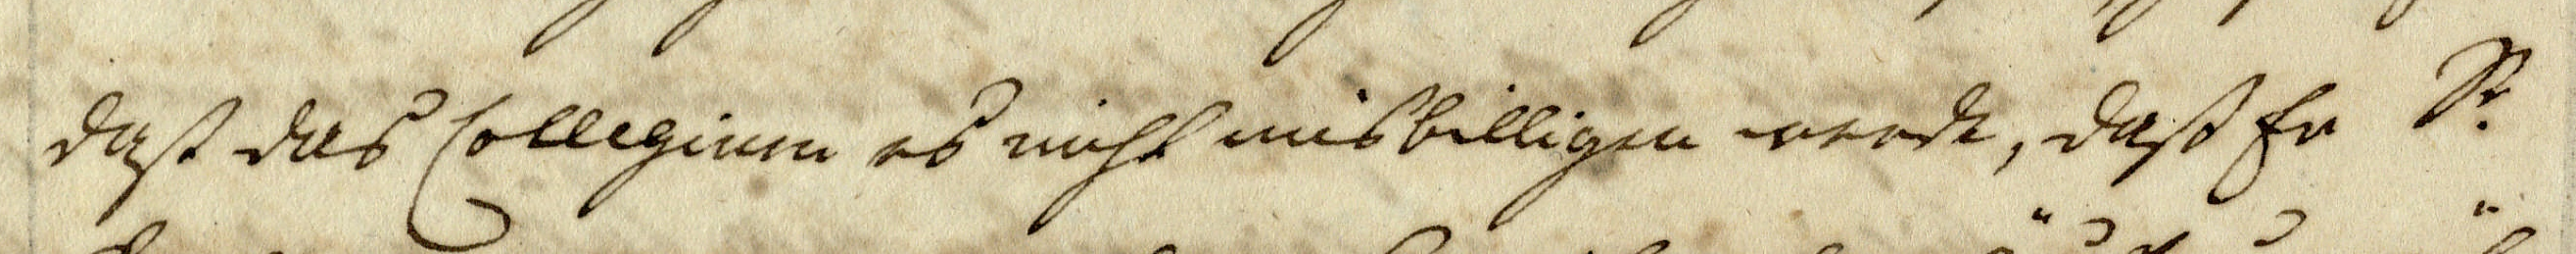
daß das Collegium es nicht misbilligen werde, daß Er Sr
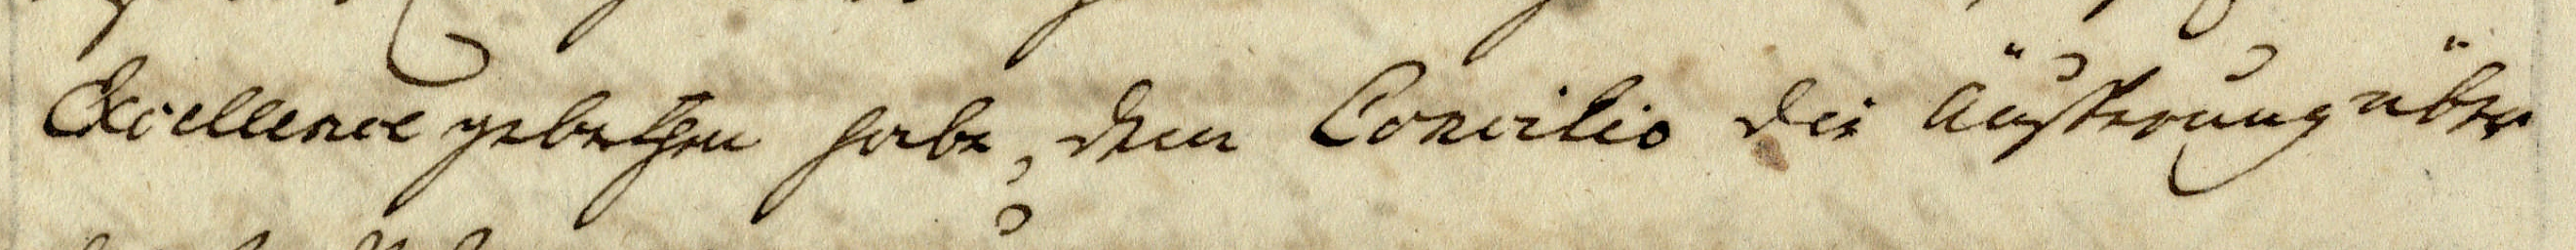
Excellence gebethen habe, dem Concilio die Äusserung über
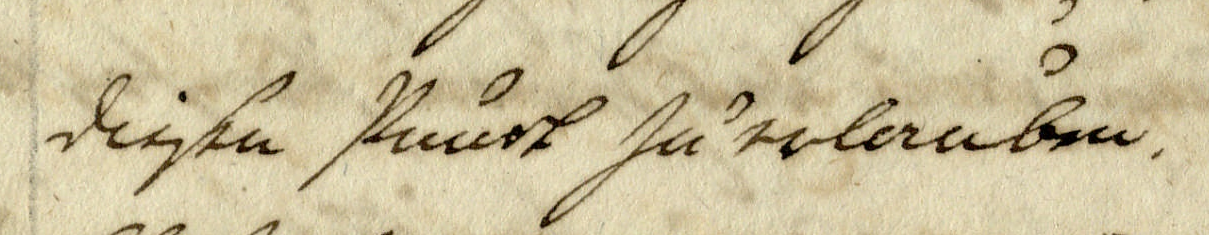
diesen Punct zu erlauben.
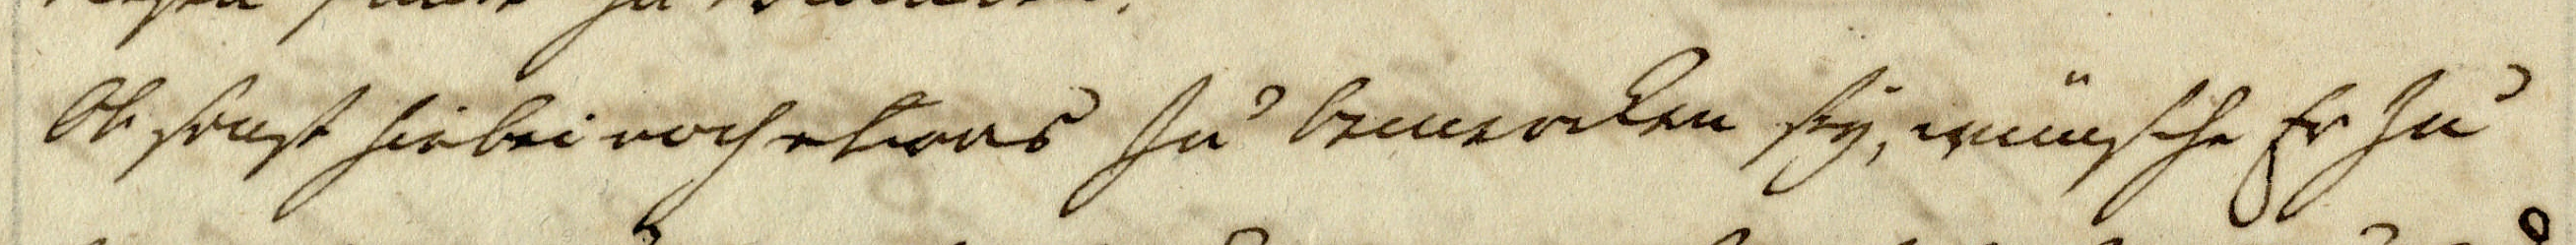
Ob sonst hiebei noch etwas zu bemercken seÿ, wünsche Er zu
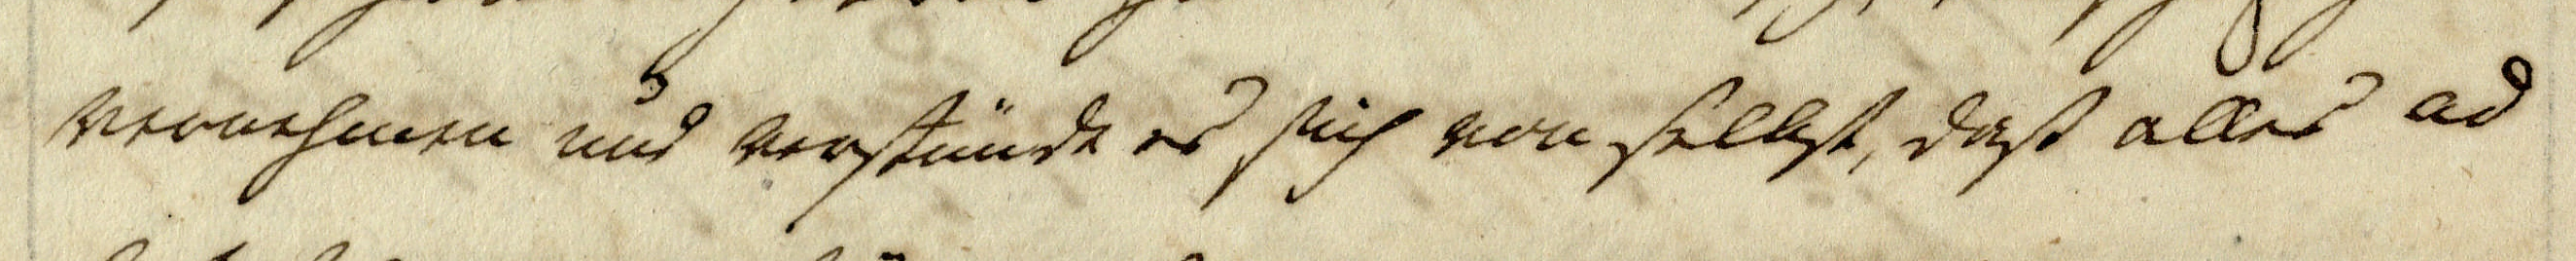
vernehmen und verstünde es sich von selbst, daß alles ad
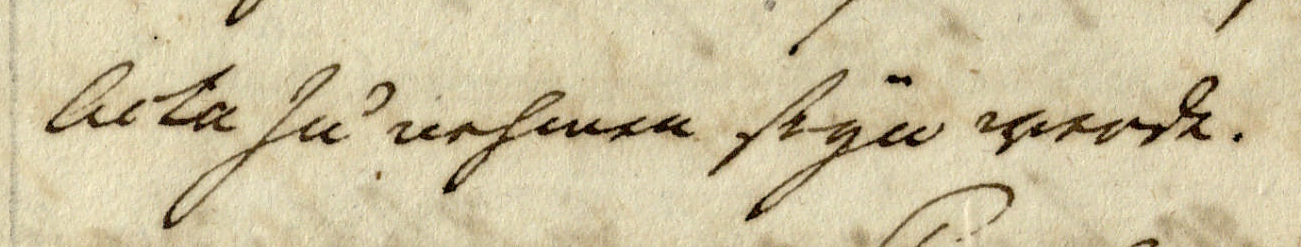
Acta zu nehmen seÿn werde.
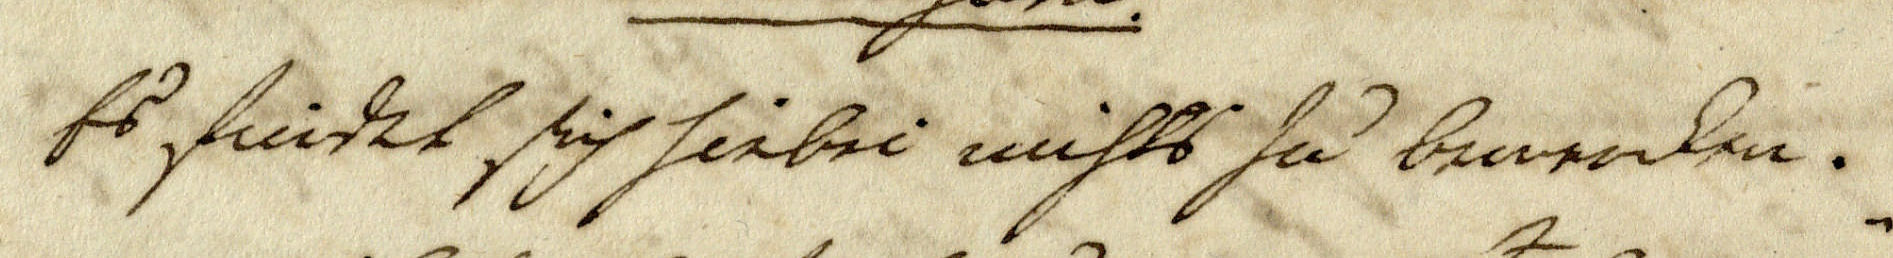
Es findet sich hiebei nichts zu bemercken.
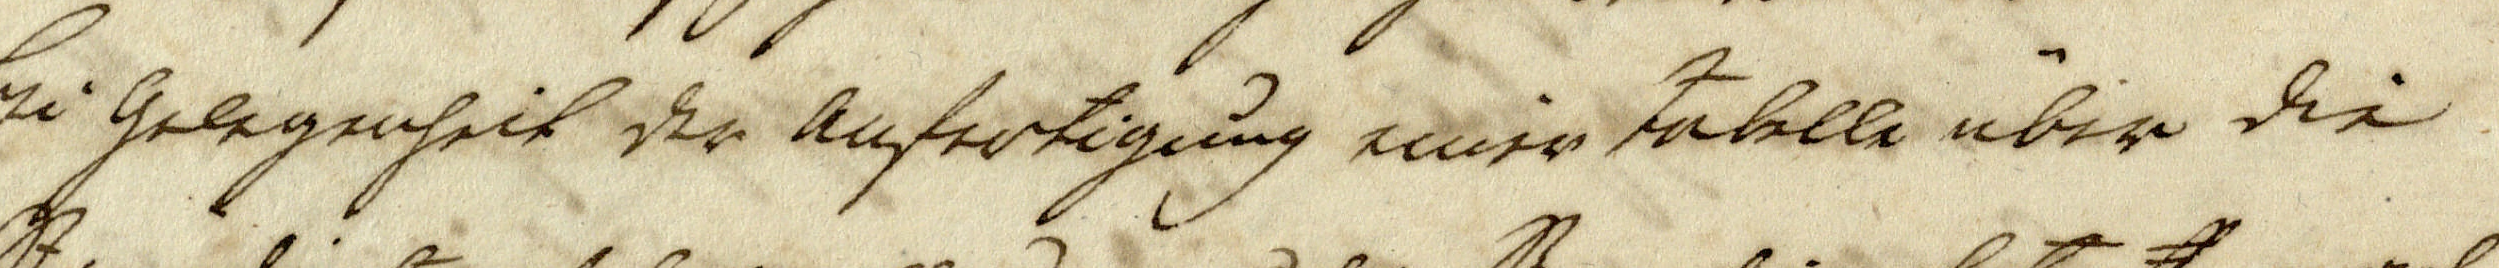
5. Bei Gelegenheit der Anfertigung einer Tabelle über die
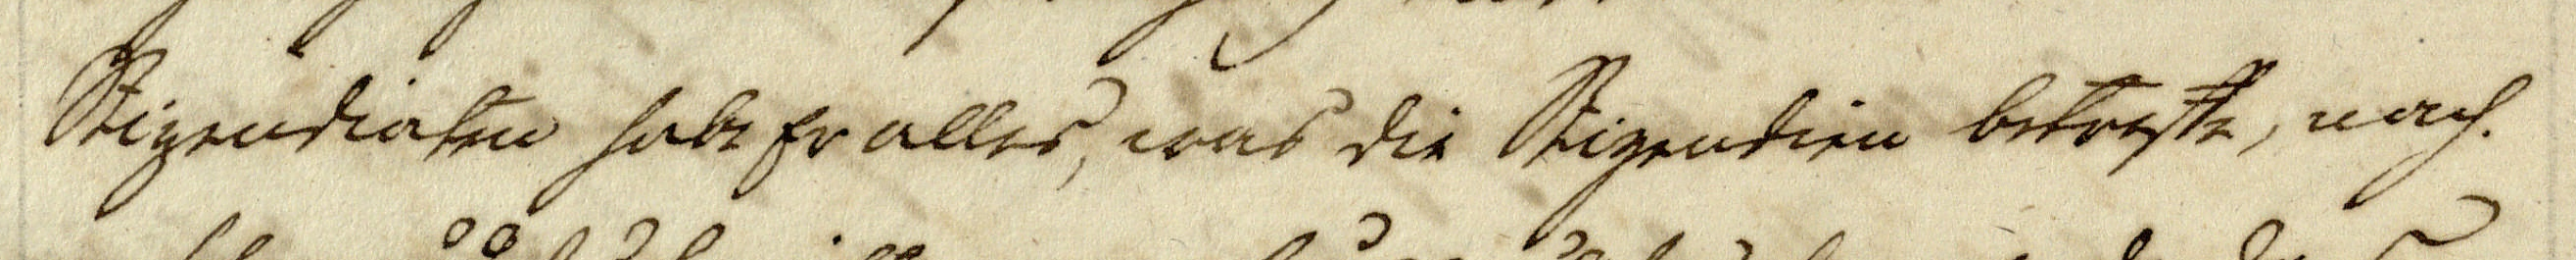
Stipendiaten habe Er alles, was die Stipendien betreffe, nach¬
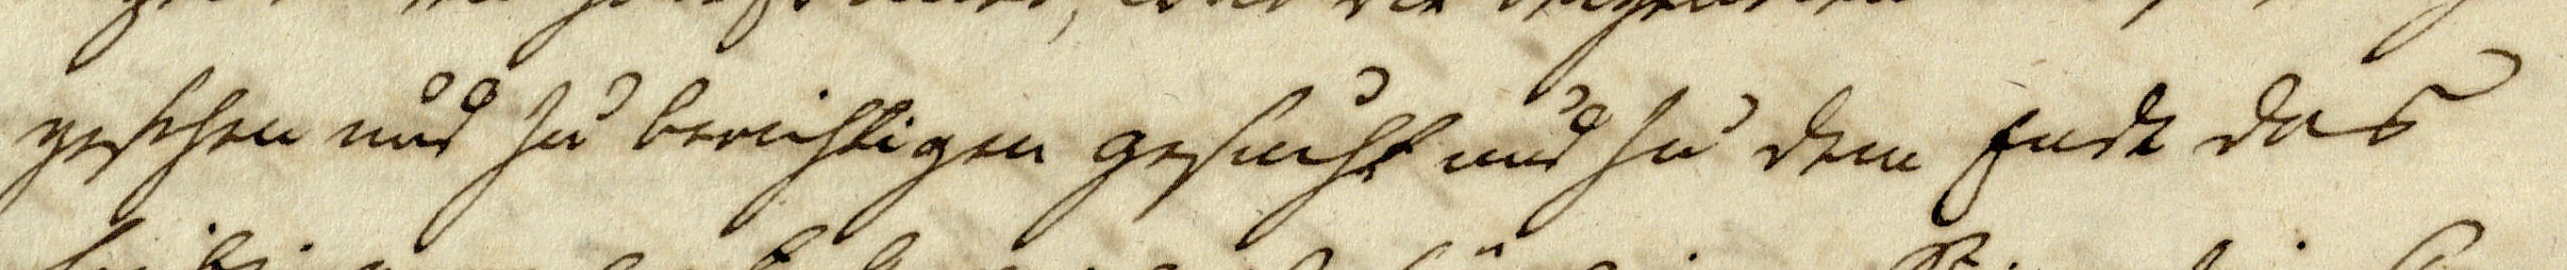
gesehen und zu berichtigen gesucht und zu dem Ende das
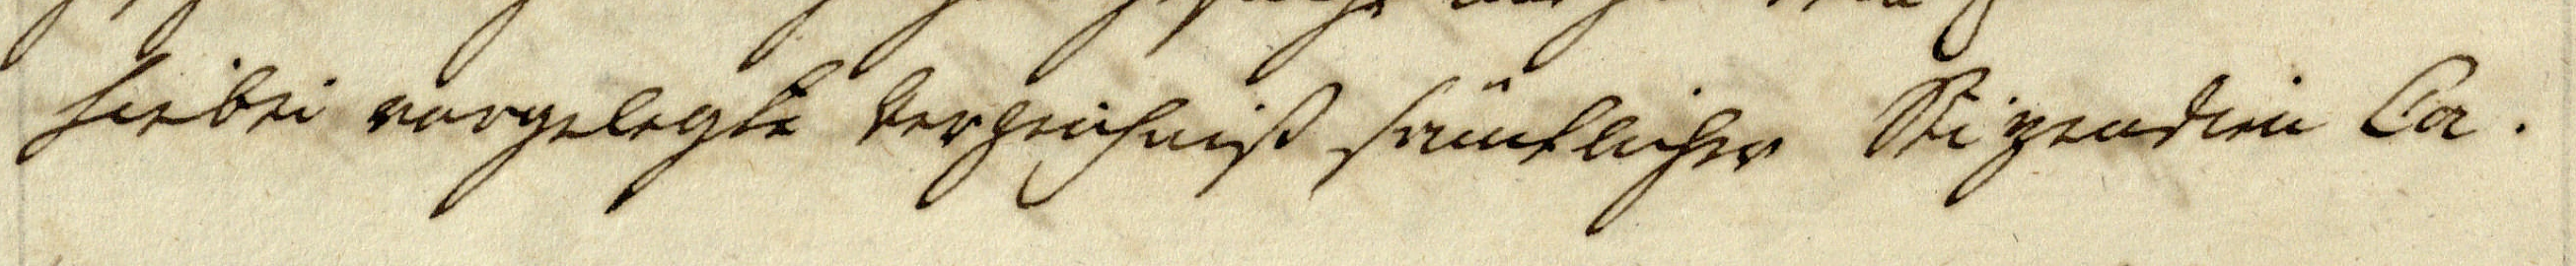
hiebei vorgelegte Verzeichniß sämtlicher Stipendien Ca¬
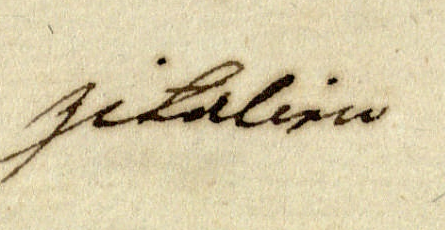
pitalien
